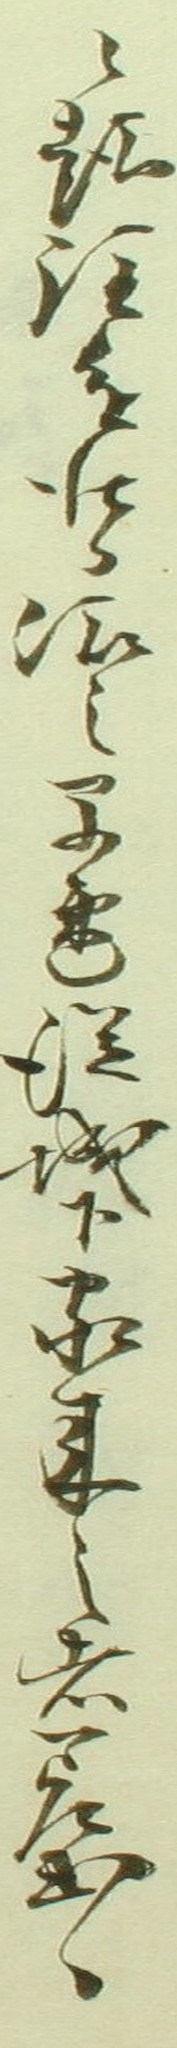候趣注進仕候依之早速従城下家来之者差出候
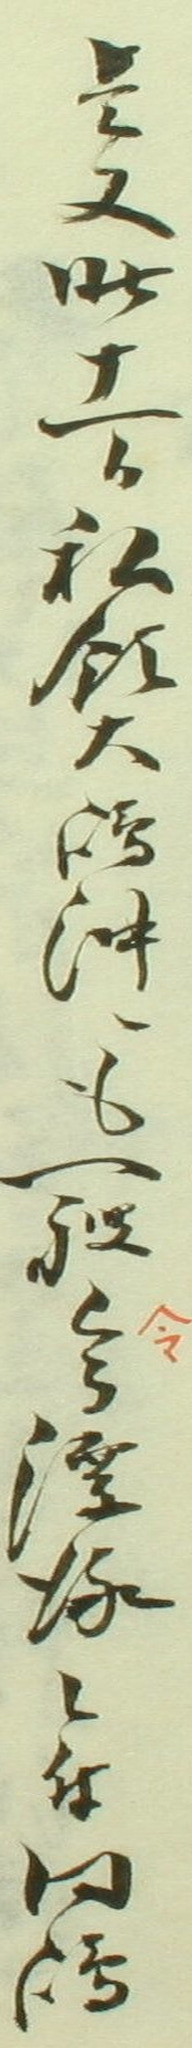是又昨十一日私領大嶋沖へも一艘今漂流ニ付同嶋
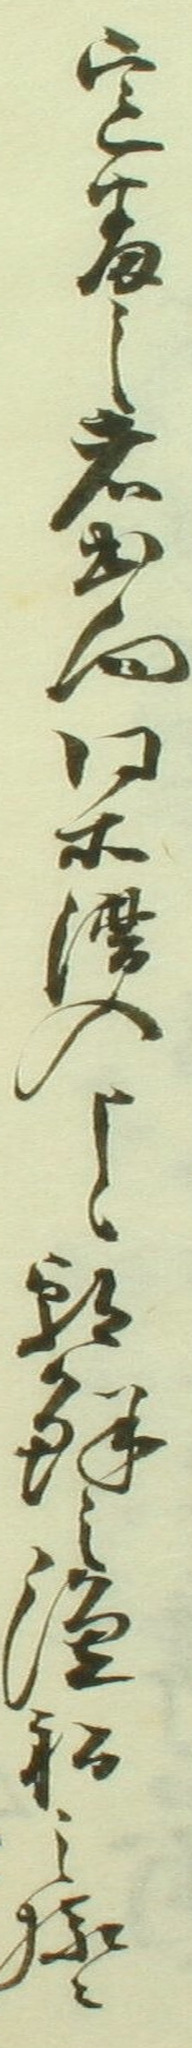定番之者出向同所漕入申候朝鮮之漁船之様ニ
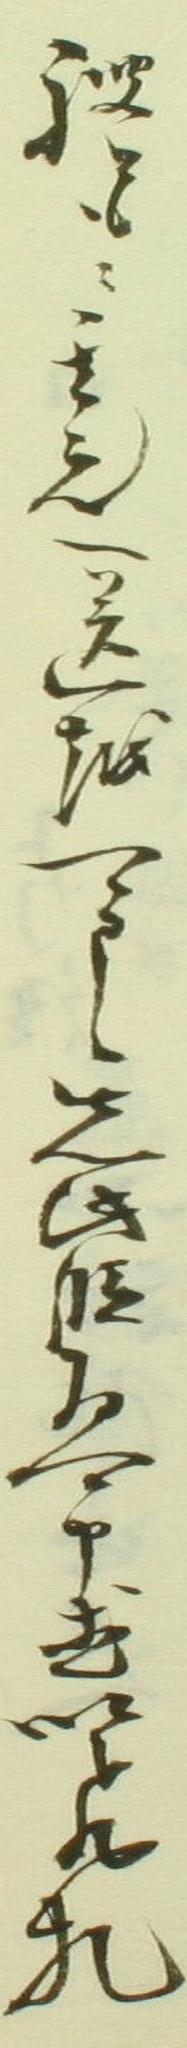艘ともニ其元へ送越可申候先此段為可申述以飛札
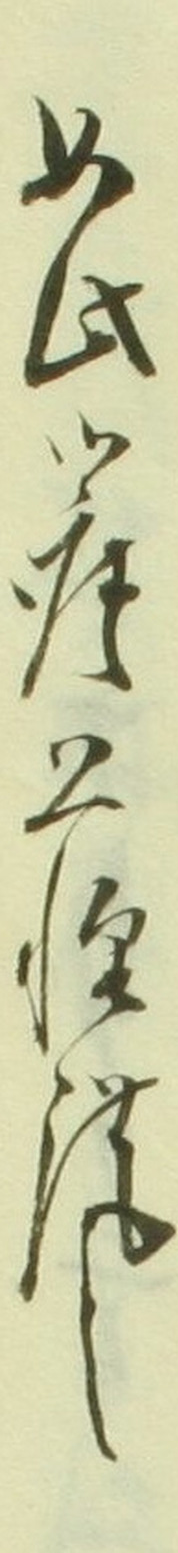如此御座候恐惶謹言
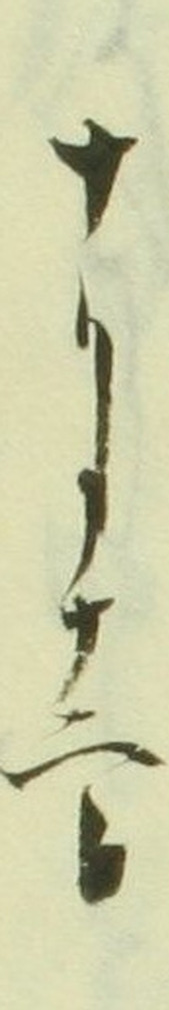十月十二日
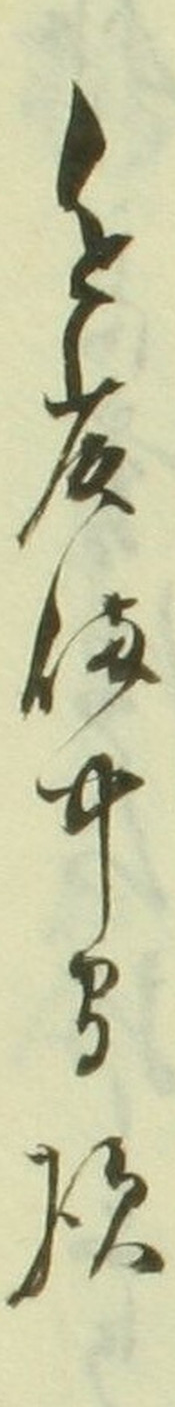近藤備中守様
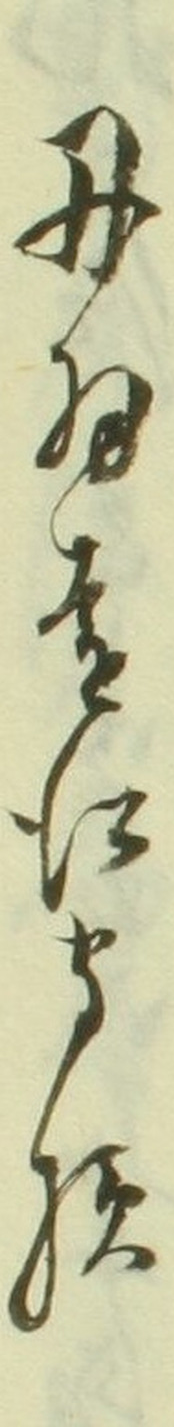丹羽遠江守様
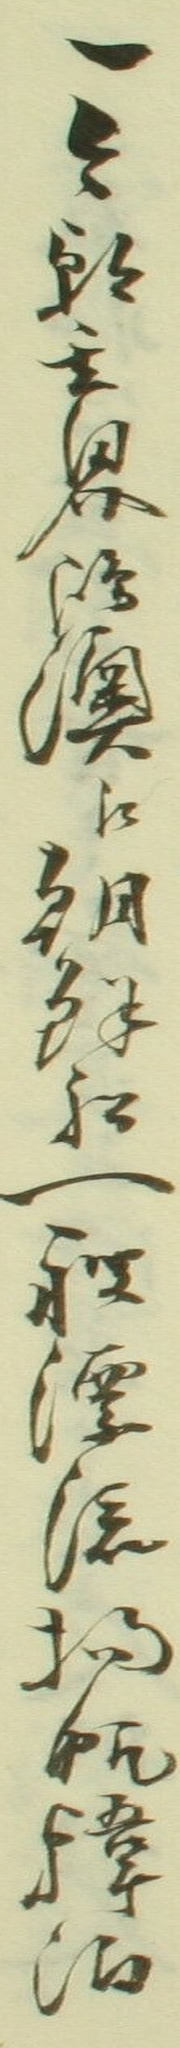一今朝玄界嶋澳江朝鮮船一艘漂流揚帆韓泊
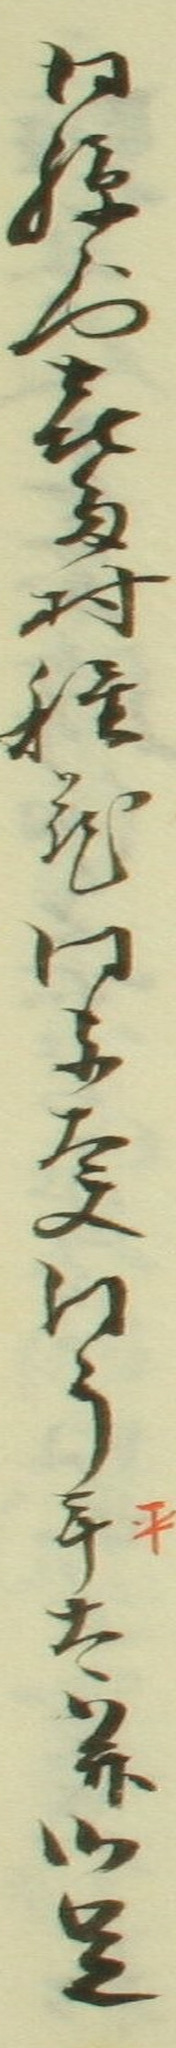同孫右衛門喜多村種蔵同与大夫同宇平太并御足

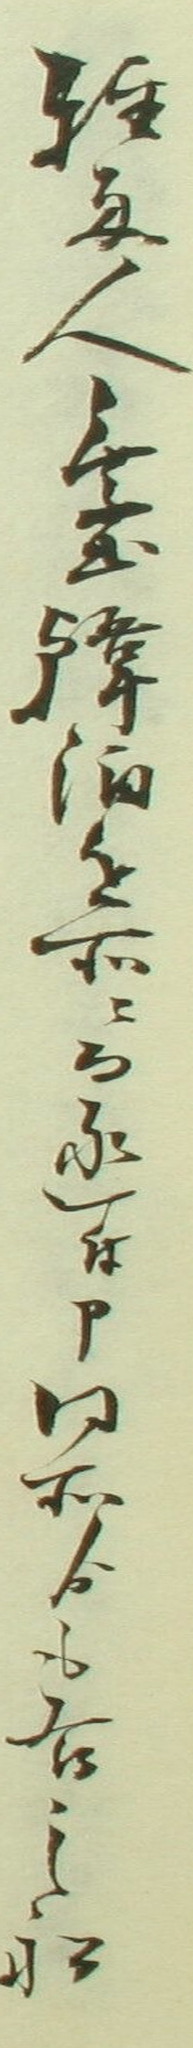軽両人乗出韓泊近所ニ而逐付申同所ゟも右之船
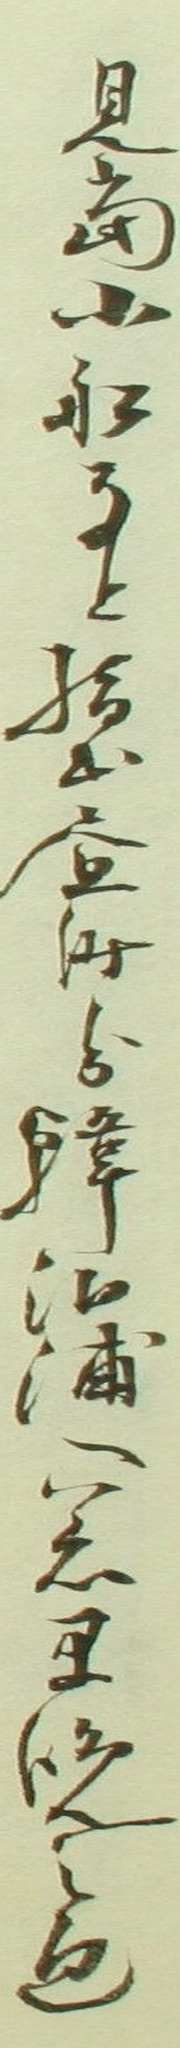見当小船なと指出昼時分韓泊へ着早晩之通
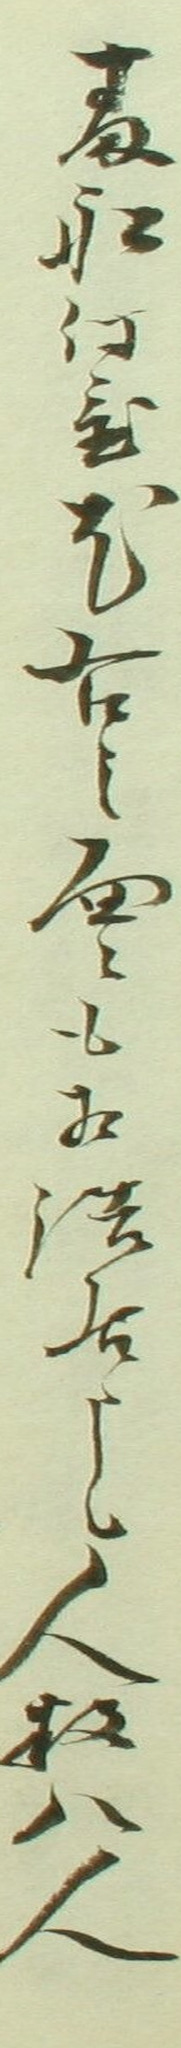番船付置尤右之面々も相詰居申候人数八人
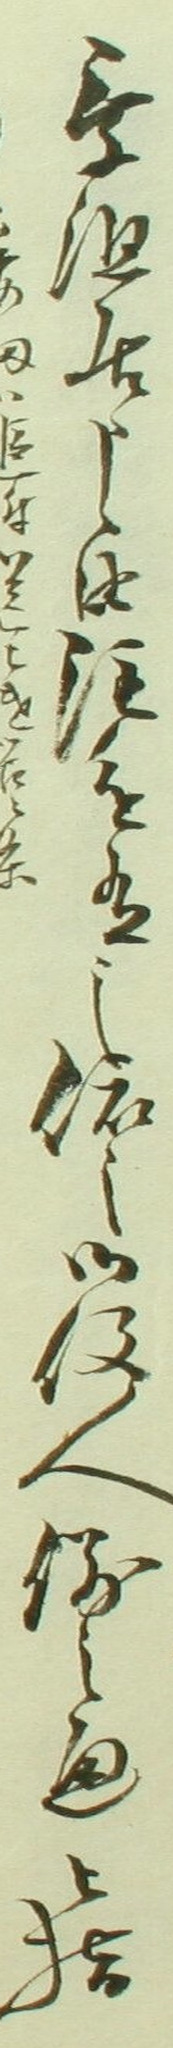乗組居申候由注進有之依之御役人例之通被指
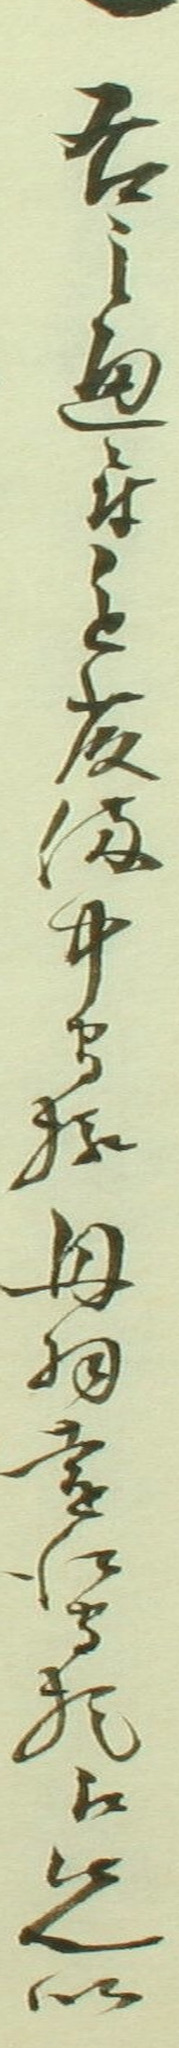一右之通ニ付近藤備中守様丹羽遠江守様江先以
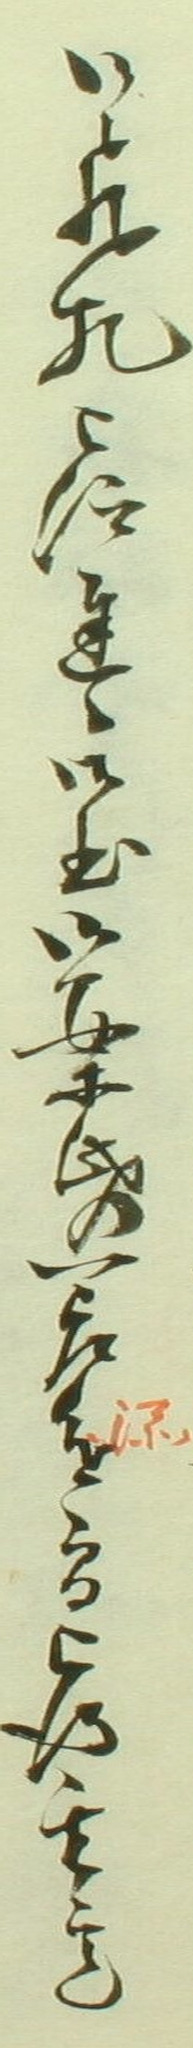御飛札被仰達候御書御案紙差進候間被得其意
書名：異国船漂着記
